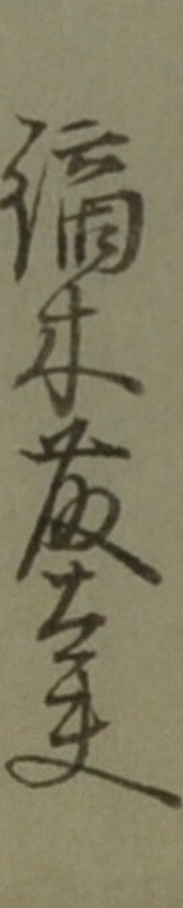鏑木藤太夫
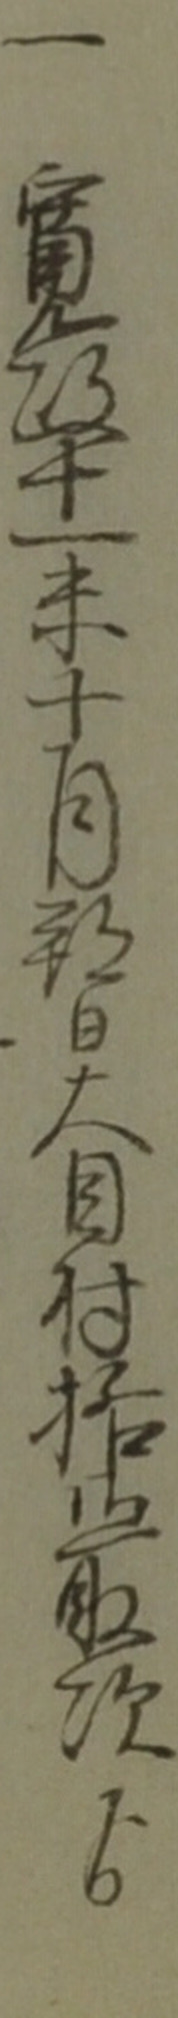一寛政十一未十月朔日大目付格御取次ゟ
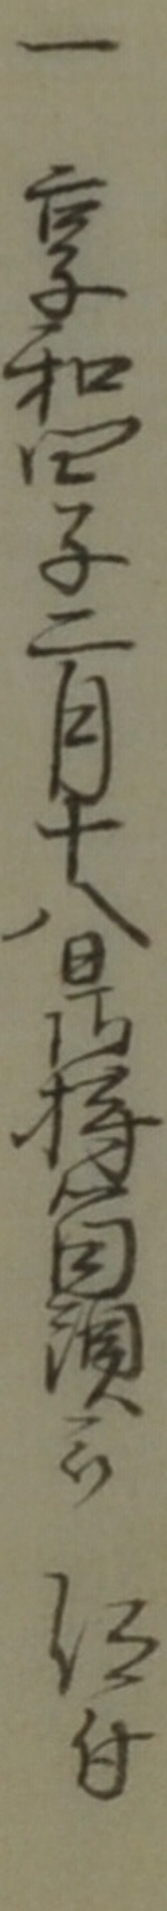一享和四子二月十八日御持筒頭被仰付
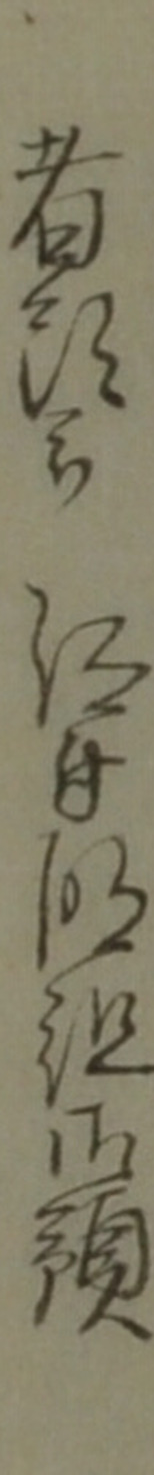者頭被仰付明組御預
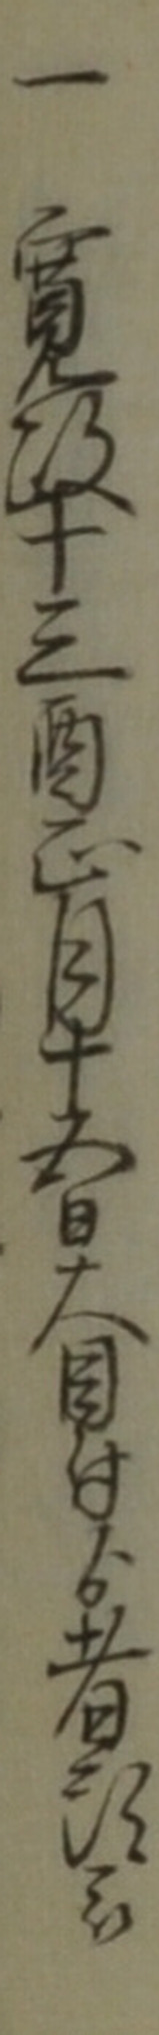一寛政十三酉正月十五日大目付ゟ者頭被
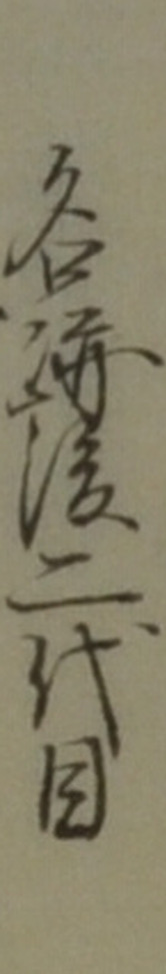名跡後二代目
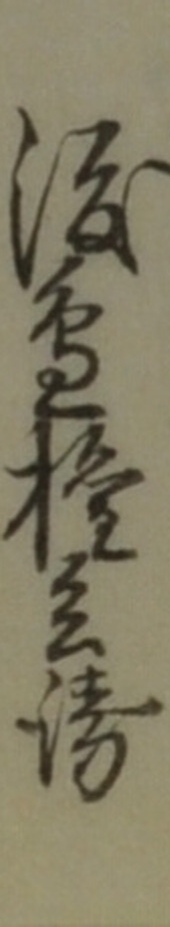渡邊権兵衛
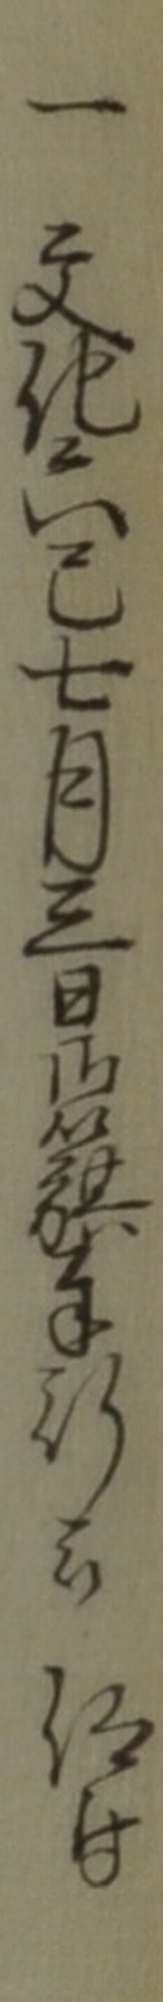一文化六巳七月三日御籏奉行被仰付
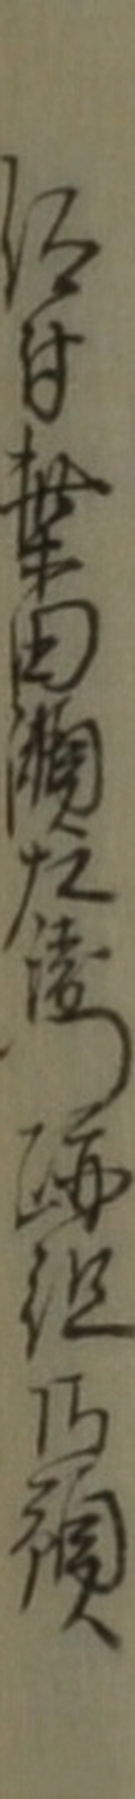仰付柴田瀬左衛門跡組御預
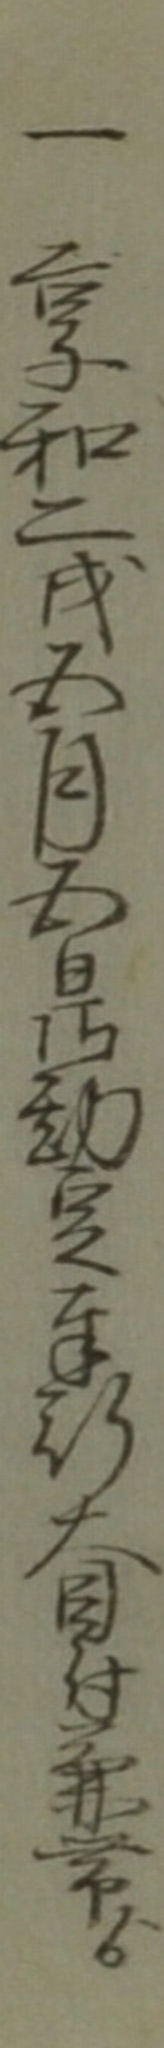一享和二戌五月五日御勘定奉行大目付兼帯ゟ
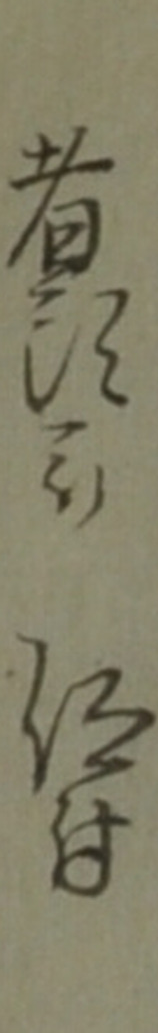者頭被仰付
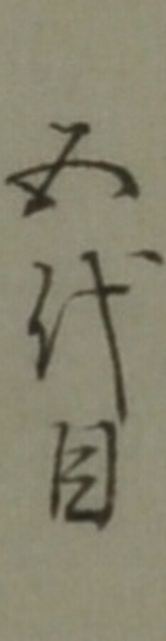五代目
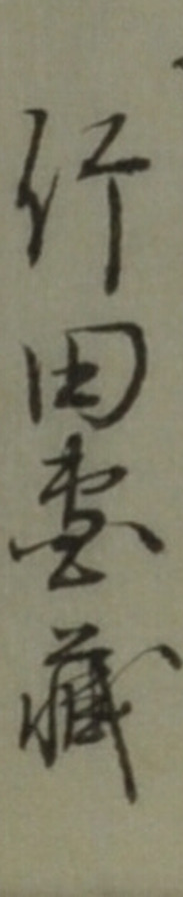竹田団蔵
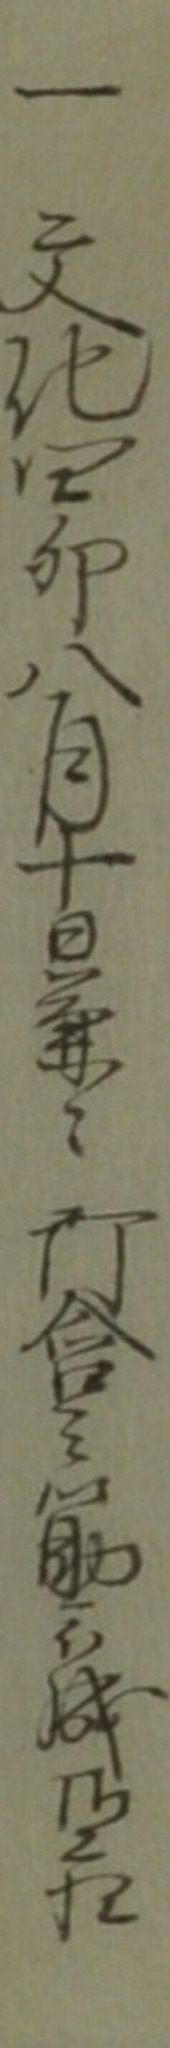一文化四卯八月十日兼々御含之筋被成御座
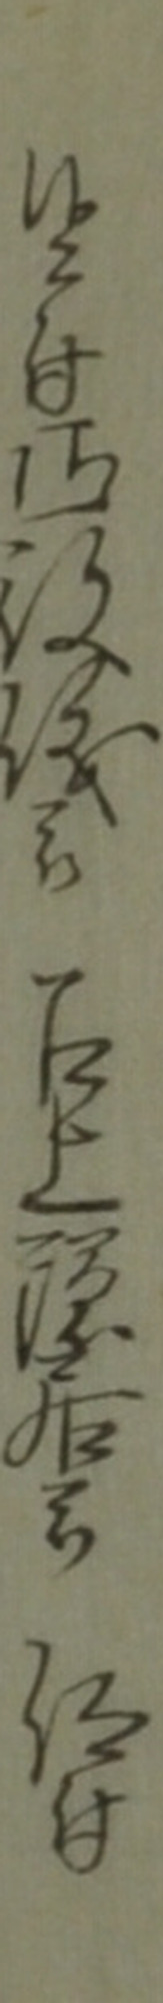候ニ付御役儀被召上隠居被仰付
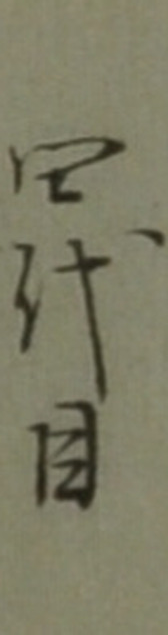四代目
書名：諸御役代々録（二）
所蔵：伊那市立高遠町図書館・合同会社AMANE
